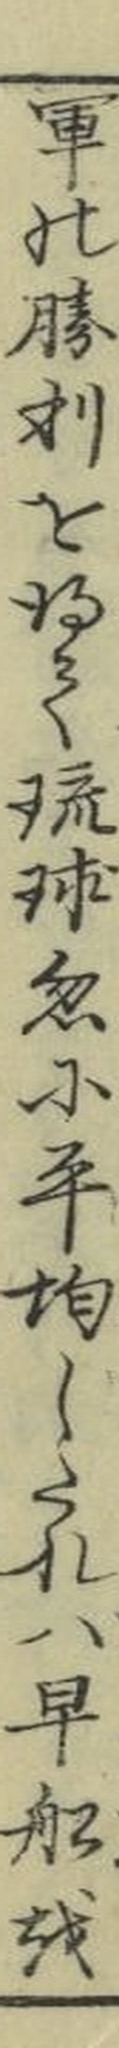軍の勝利を得て、琉球忽に平均したれば、早船を
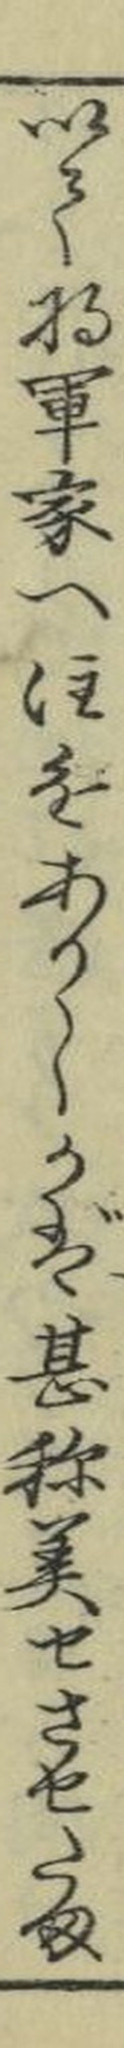以て将軍家へ注進ありしかば、甚称美せさせたま
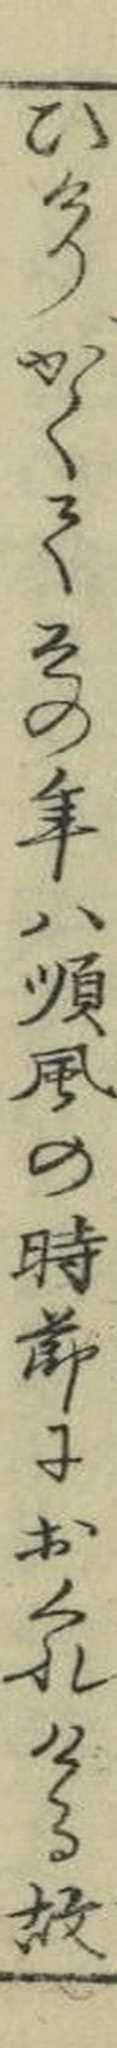ひけり、かくてその年は順風の時節におくれける故
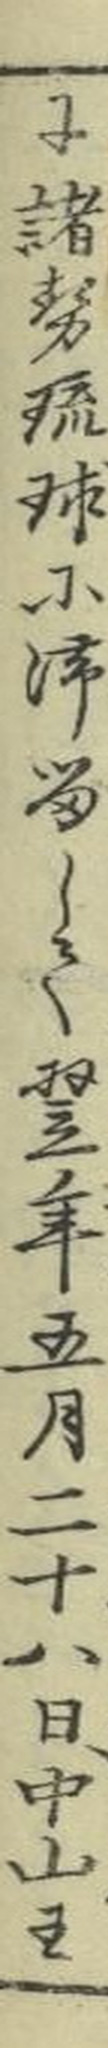に、諸勢琉球に滞留して、翌年五月二十八日、中山王
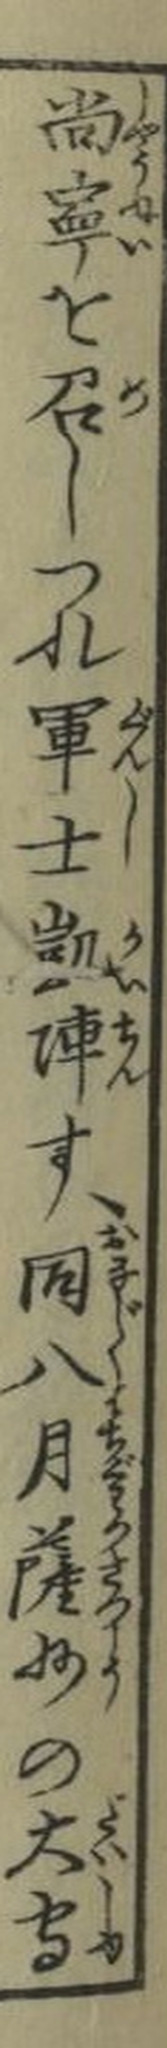尚寧を召しつれ軍士凱陣す、同八月薩州の大守
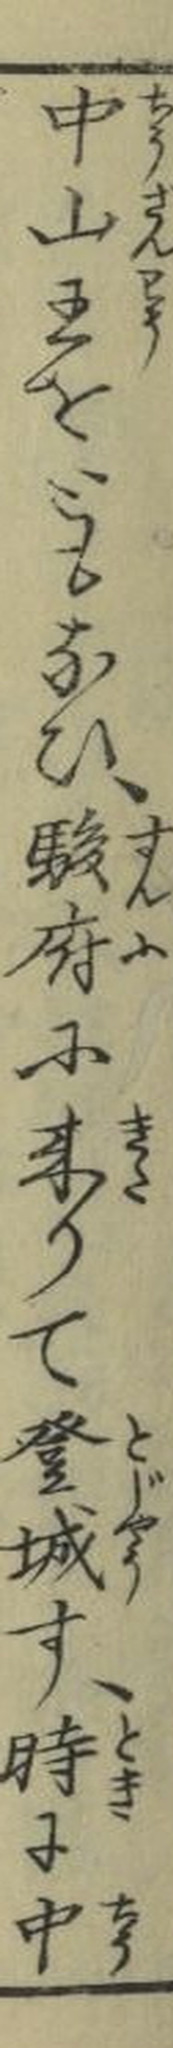中山王をともなひ、駿府に来りて登城す、時に中
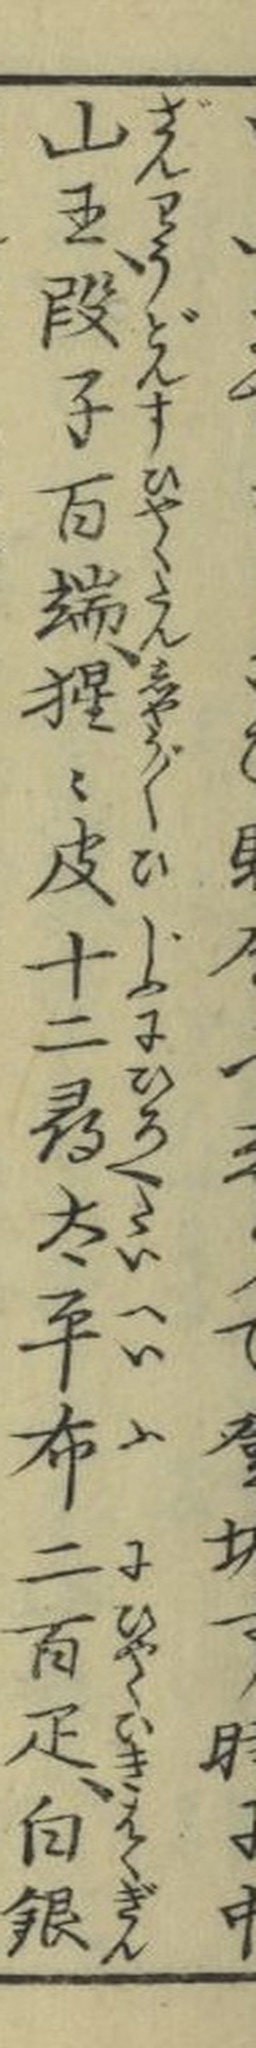山王、段子百端、猩々皮十二尋、太平布二百疋、白銀
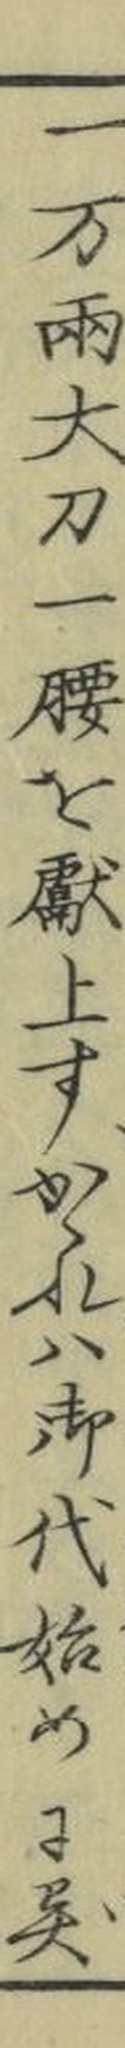一万両、大刀一腰を献上す、かゝれば御代始めに異
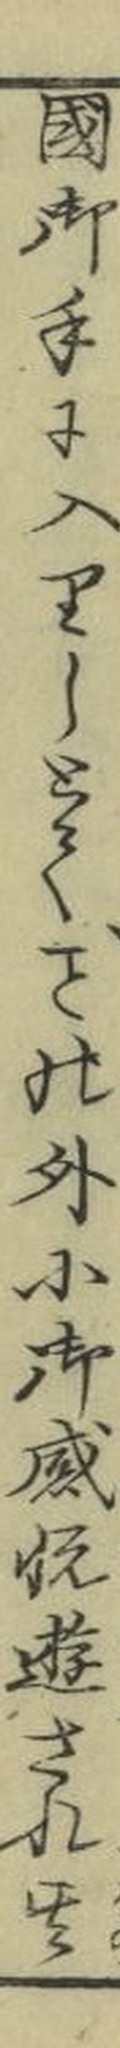国御手に入りしとて、ことの外に御感悦遊され、其
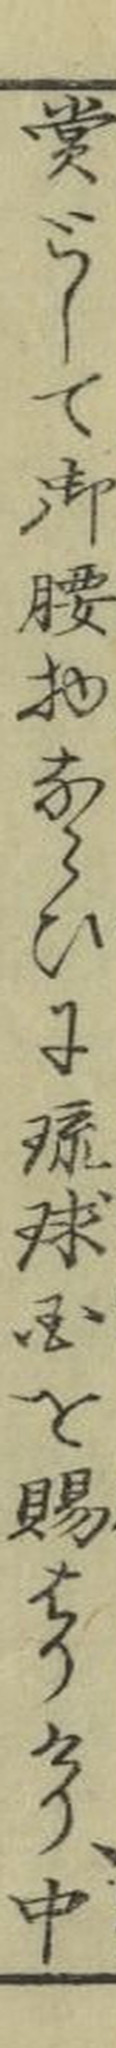賞として、御腰物ならびに琉球国を賜はりけり、中
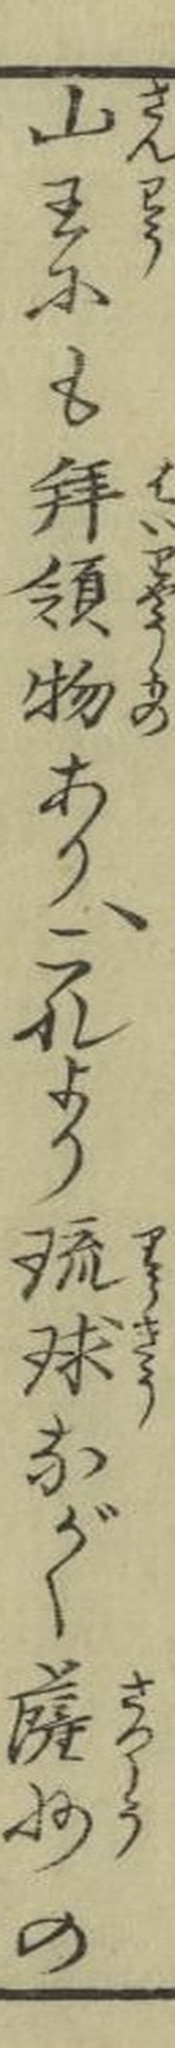山王にも拝領物あり、これより琉球ながく薩州の
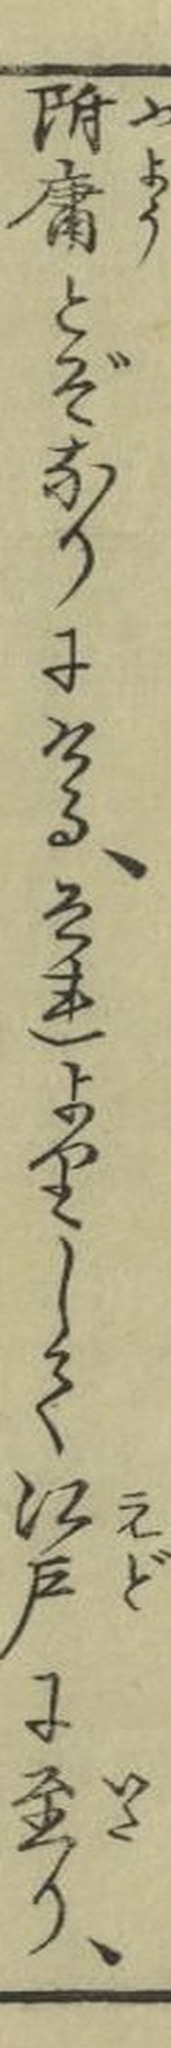附庸とぞなりにける、それよりして江戸に至り、
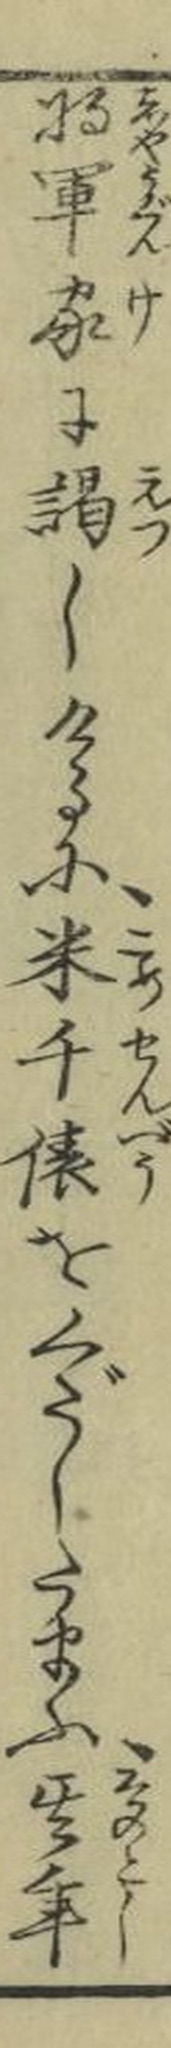将軍家に謁しけるに、米千俵をくだしたまふ、其年

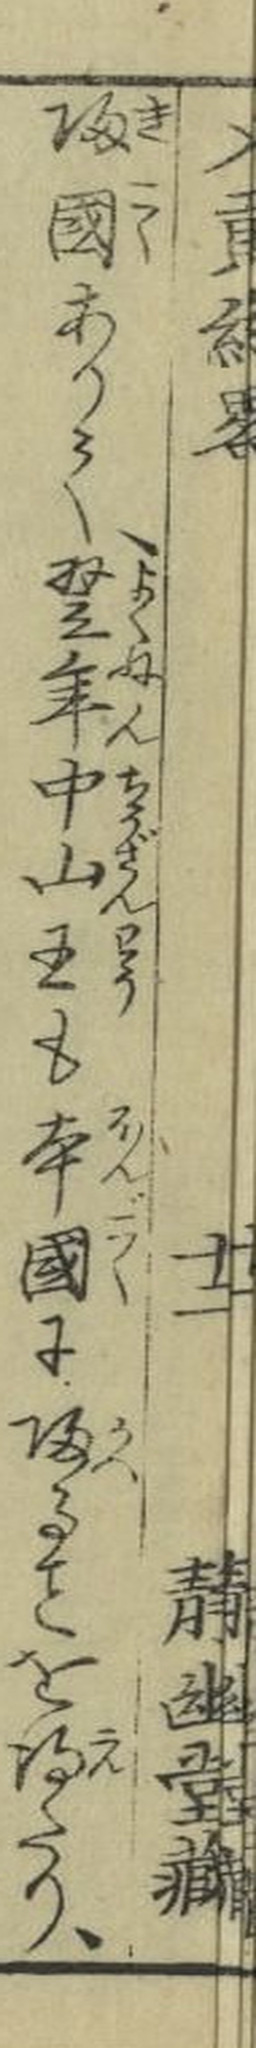帰国ありて、翌年中山王も本国に帰ることを得たり、
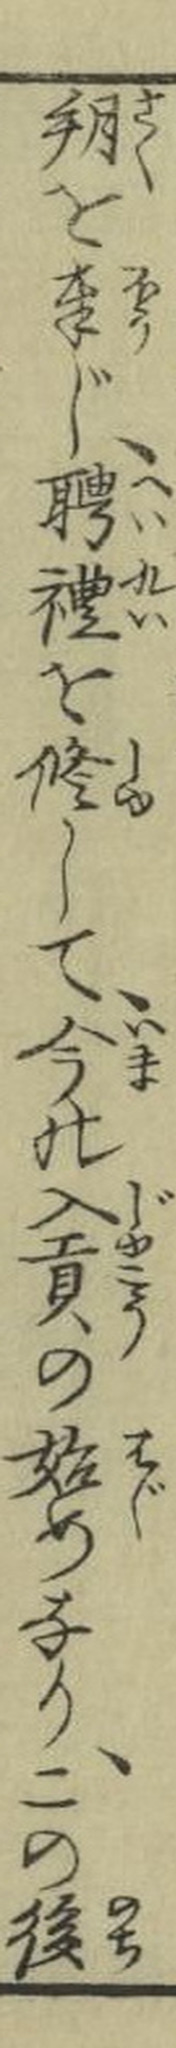朔を奉じ、聘礼を修して、今の入貢の始めなり、この後
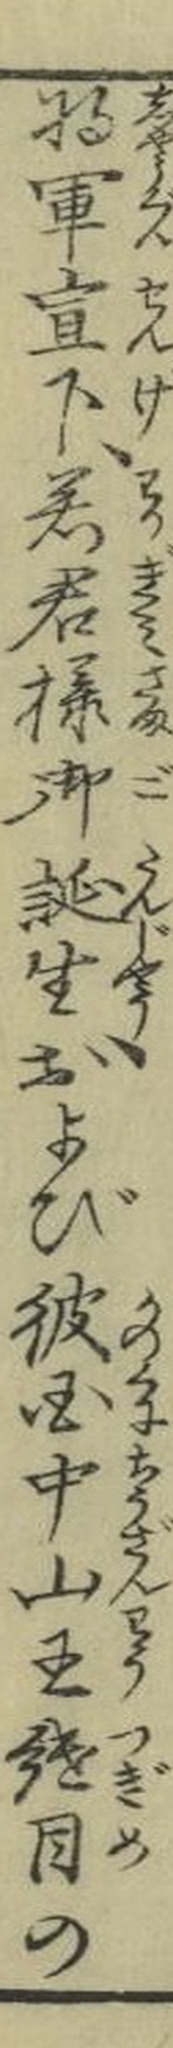将軍宣下、若君様御誕生、および彼国中山王継目の
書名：琉球入貢紀略
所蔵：University of the Ryukyus Library
